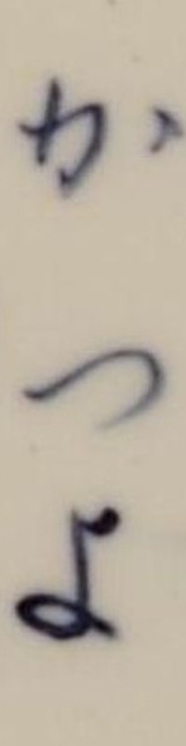かつよ
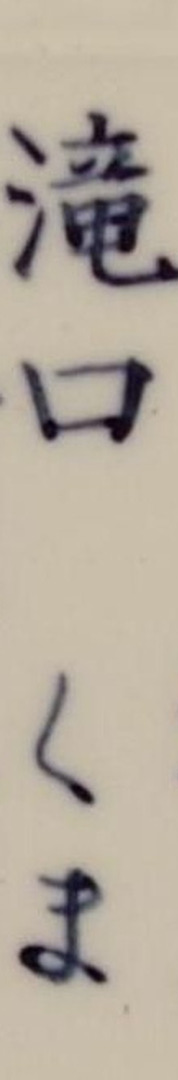滝口くま
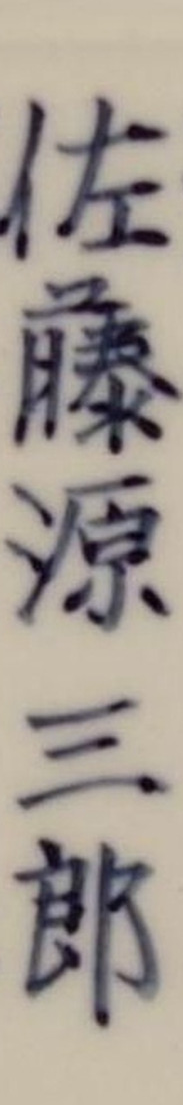佐藤源三郎
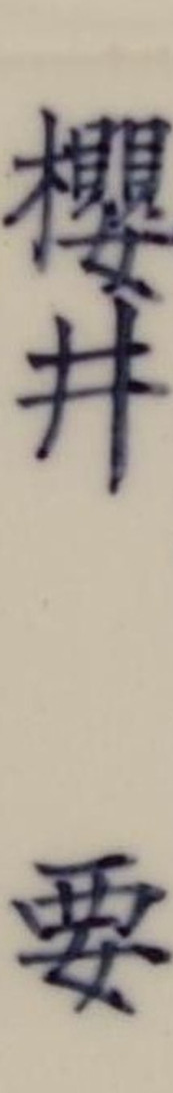櫻井要
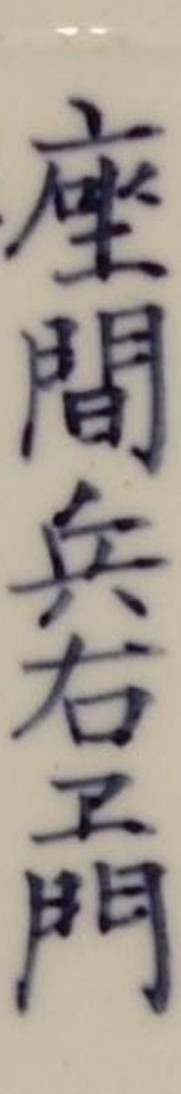座間兵右ヱ門
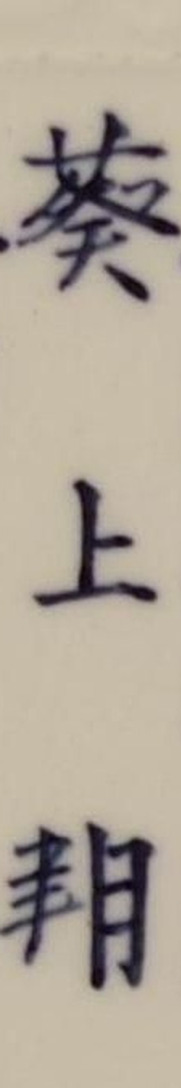葵上朔
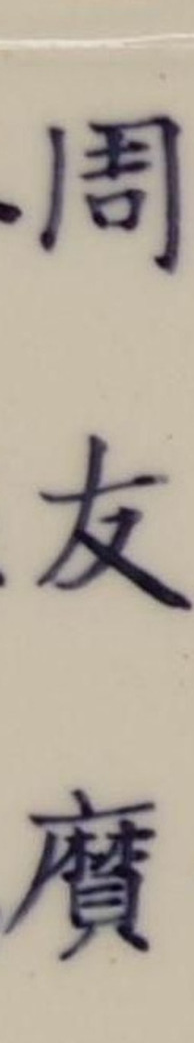周友広
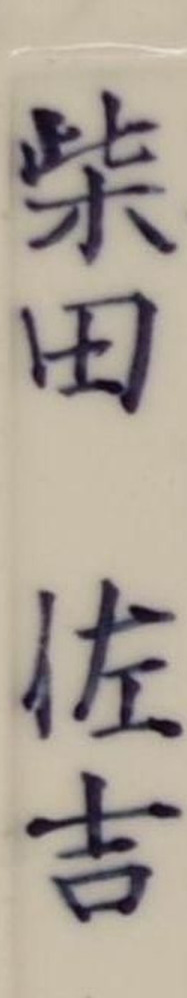柴田佐吉

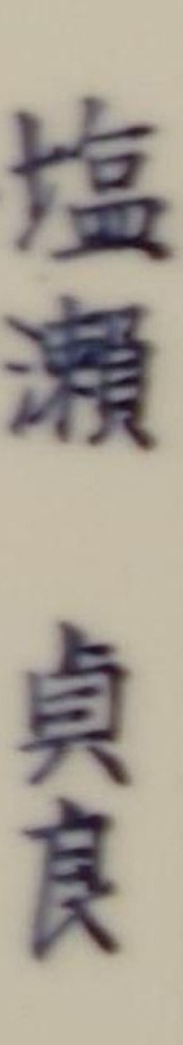塩瀬貞良
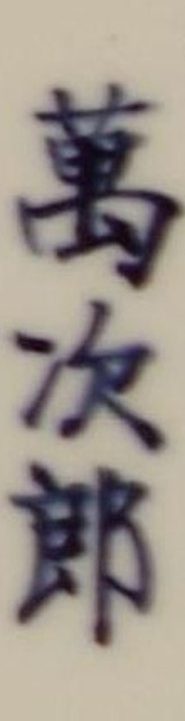万次郎
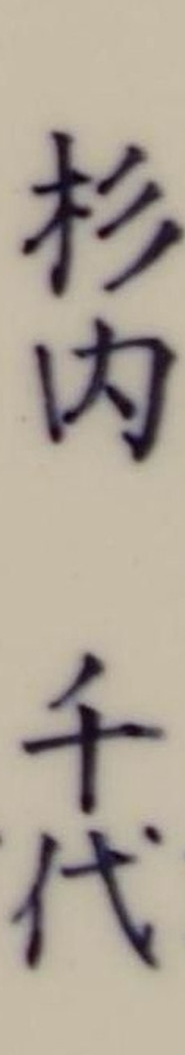杉内千代
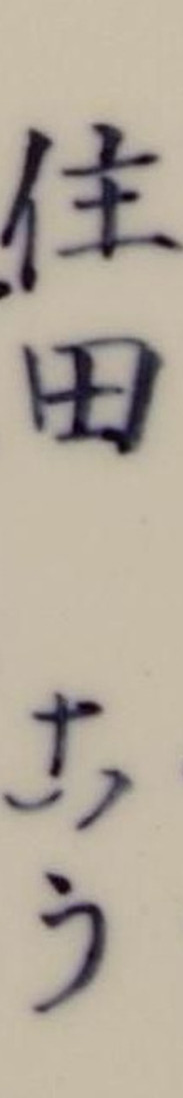住田こう
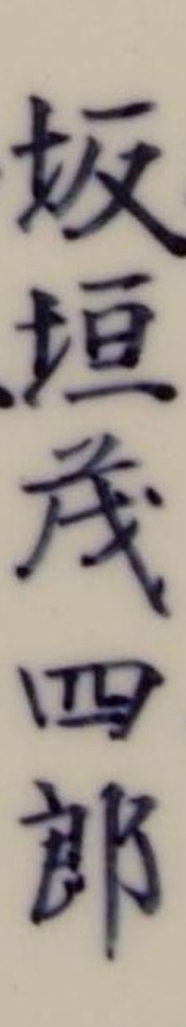坂垣茂四郎
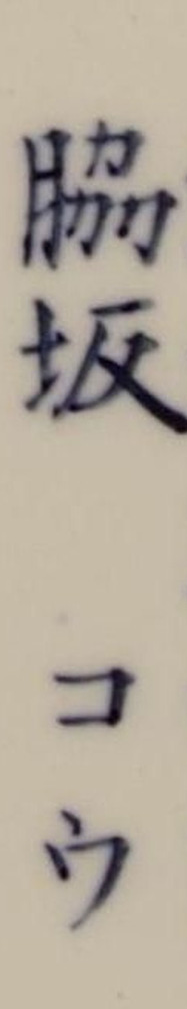脇坂コウ
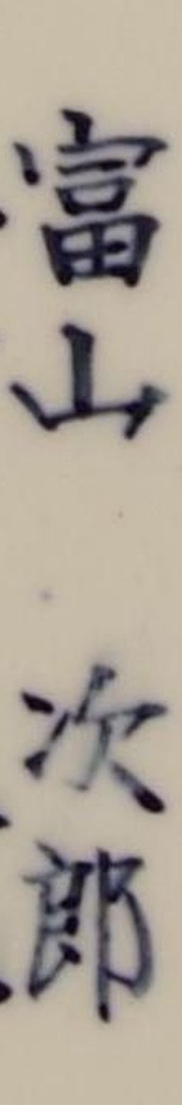冨山次郎
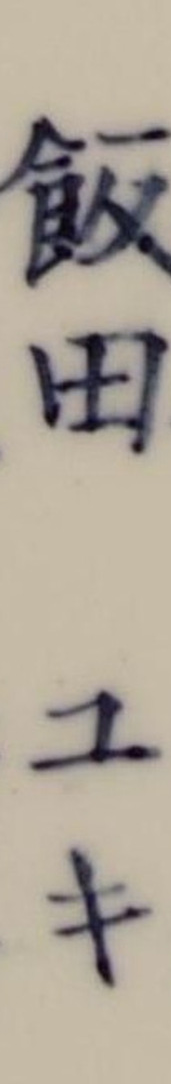飯田ユキ
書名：M~S
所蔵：高野山金剛峯寺
